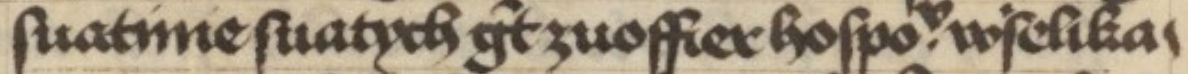ſuatinie ſuatych g̑t zuoffier hoſpo.v wẛelika
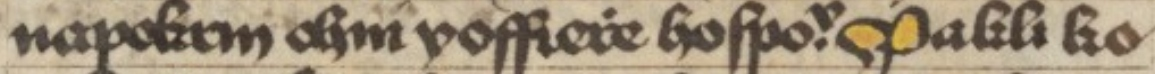napokrm ohni y offieṙe hoſpo.v Pakli ko-
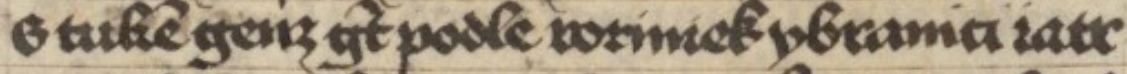s tukȇ genz g̑t podle roziniek ybranici iatr-
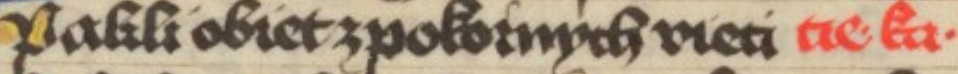Pakli obiet zpokornych vieci tie ka·
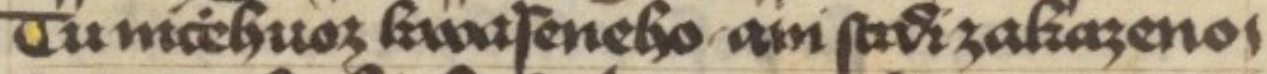Tu niċehuoz kwaſeneho ani ſtrdi zakazeno
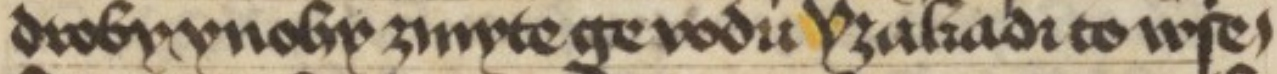droby ynohy zmyte ge vodu Y zakadi to wẛe
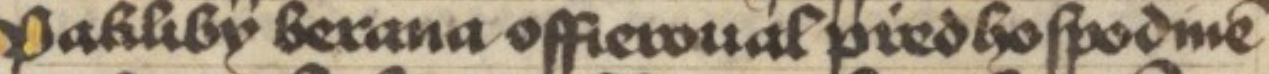Pakliby berana offieroual pṙed hoſpodinȇ
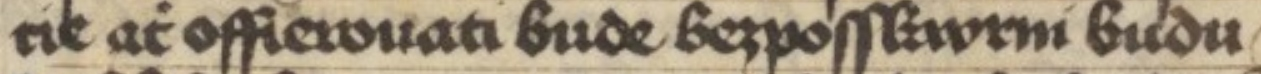cie aċ offierouati bude bezpoſſkwrni budu
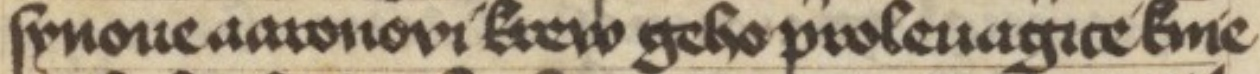ſynoue aaronovi krew geho proleuagice knie
